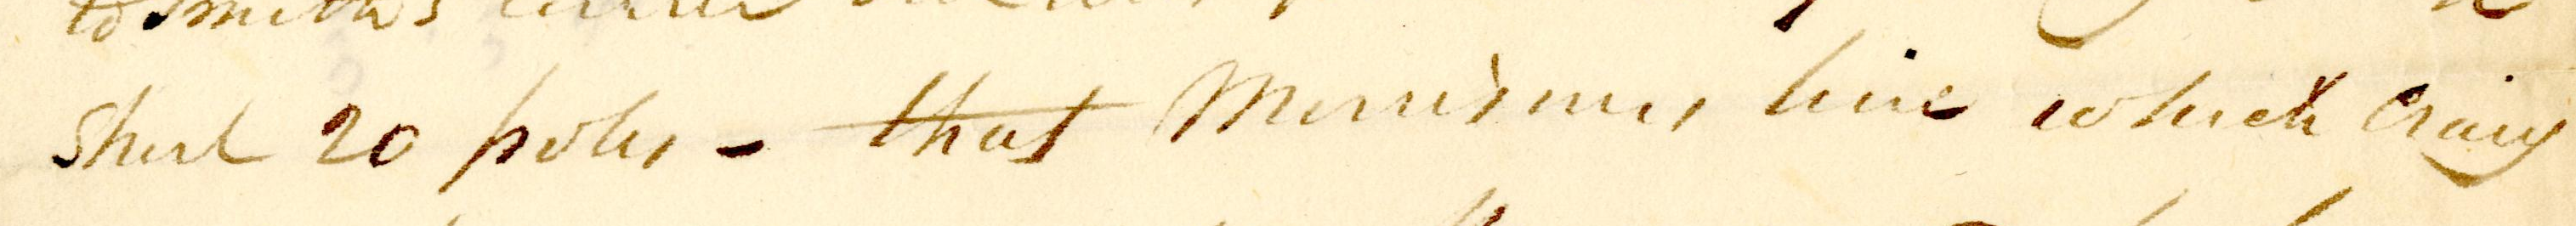short 20 poles- that Morrisons him which Craig
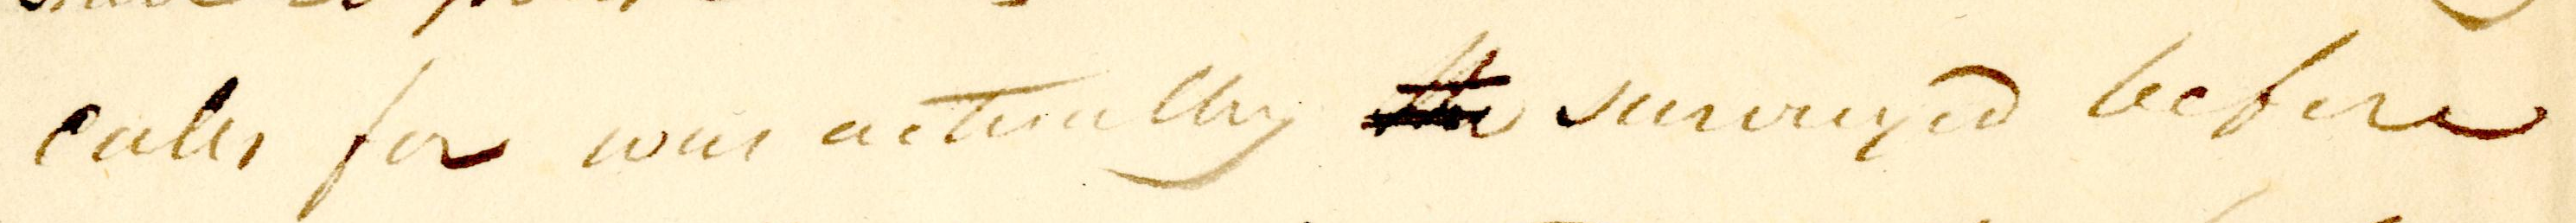calls for was actually [_] surveyed before
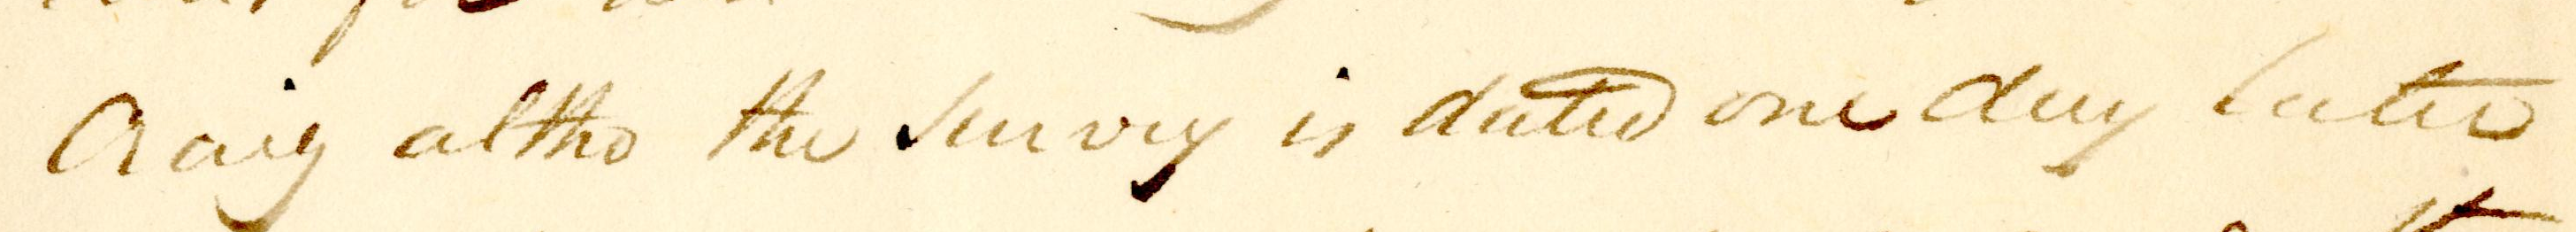Craig altho the survey is dated one day later
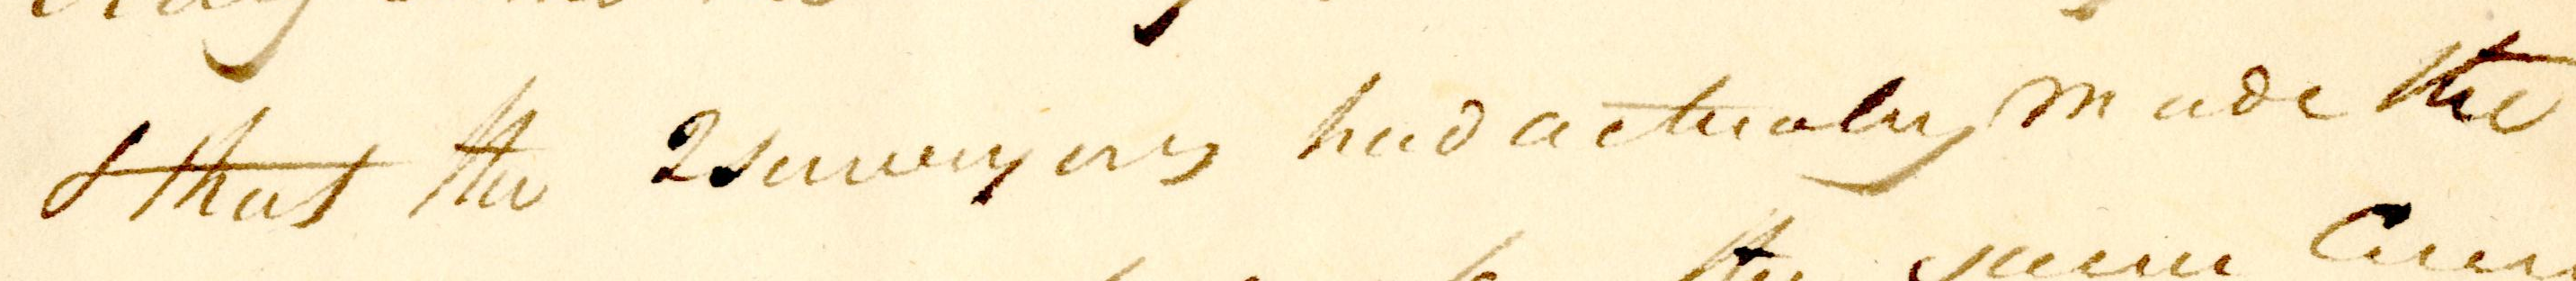& that the 2 surveyers had actualy made the
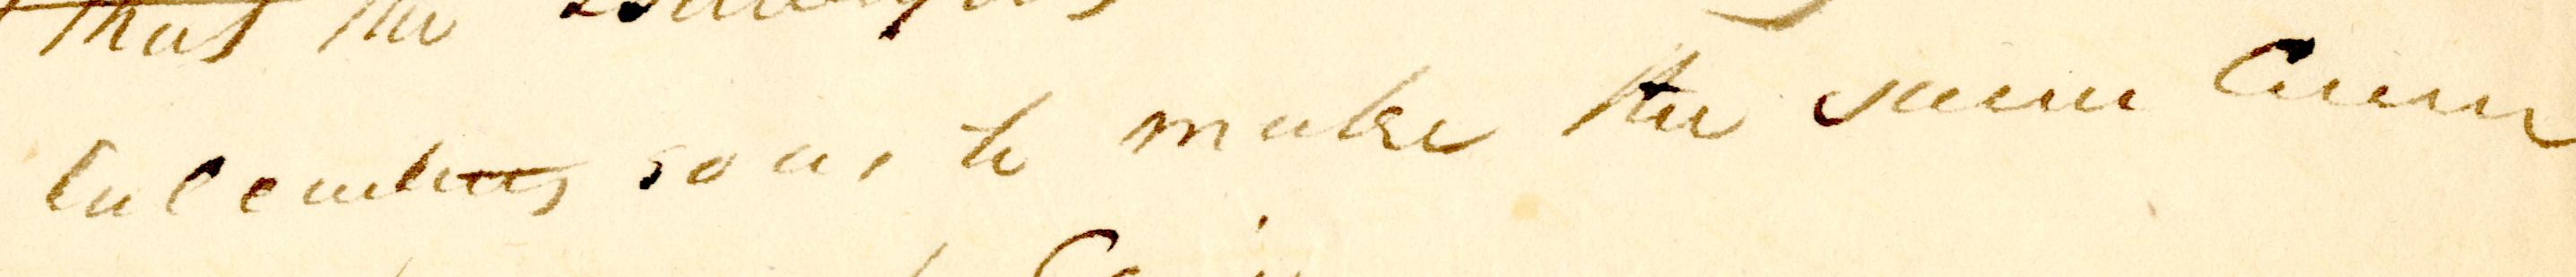Calculate, so as to make the scene seem
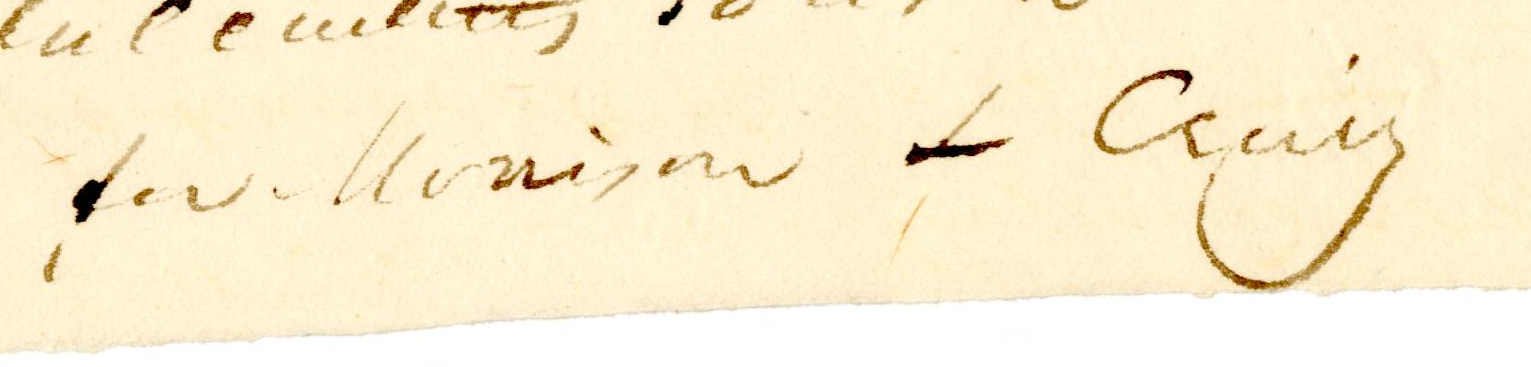for Morison-Craig
